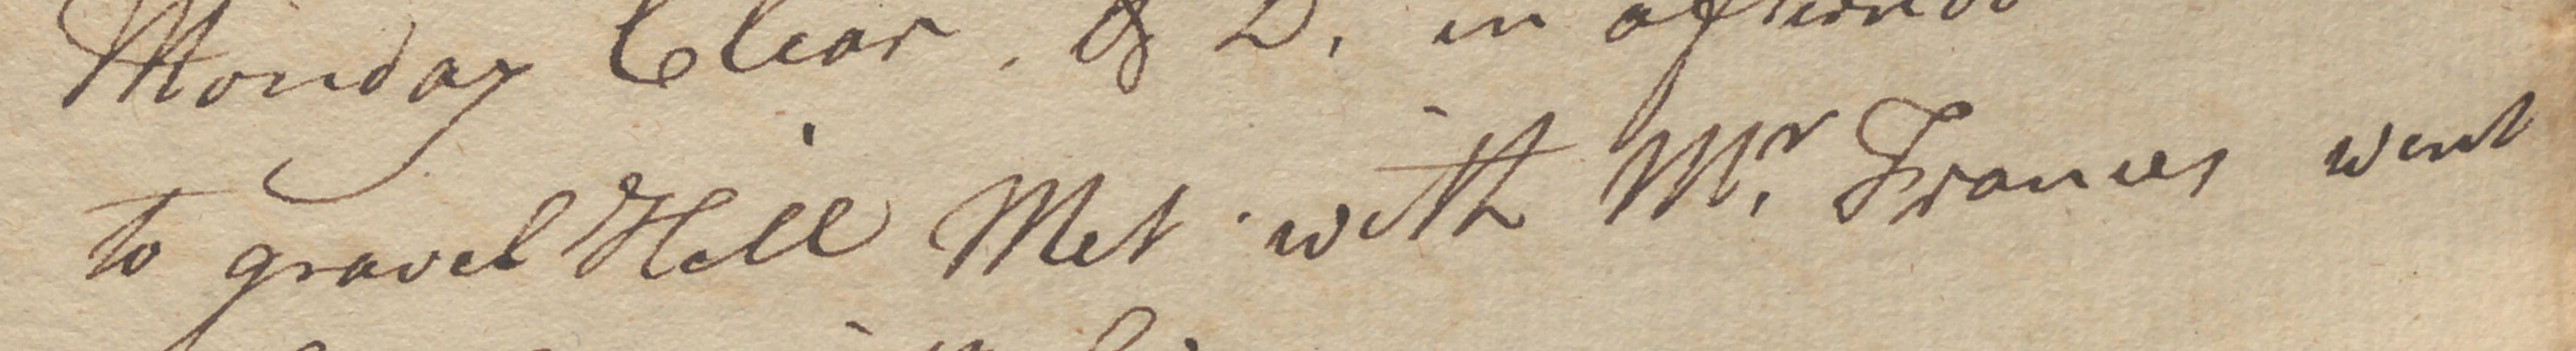to gravel Hill Met. with M^r. Frances went
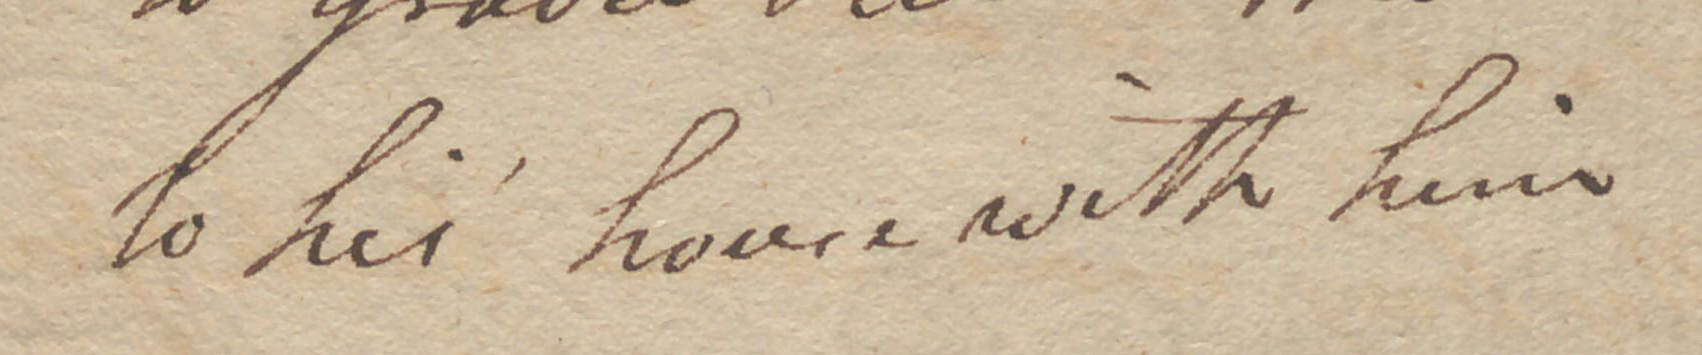to his houre with him
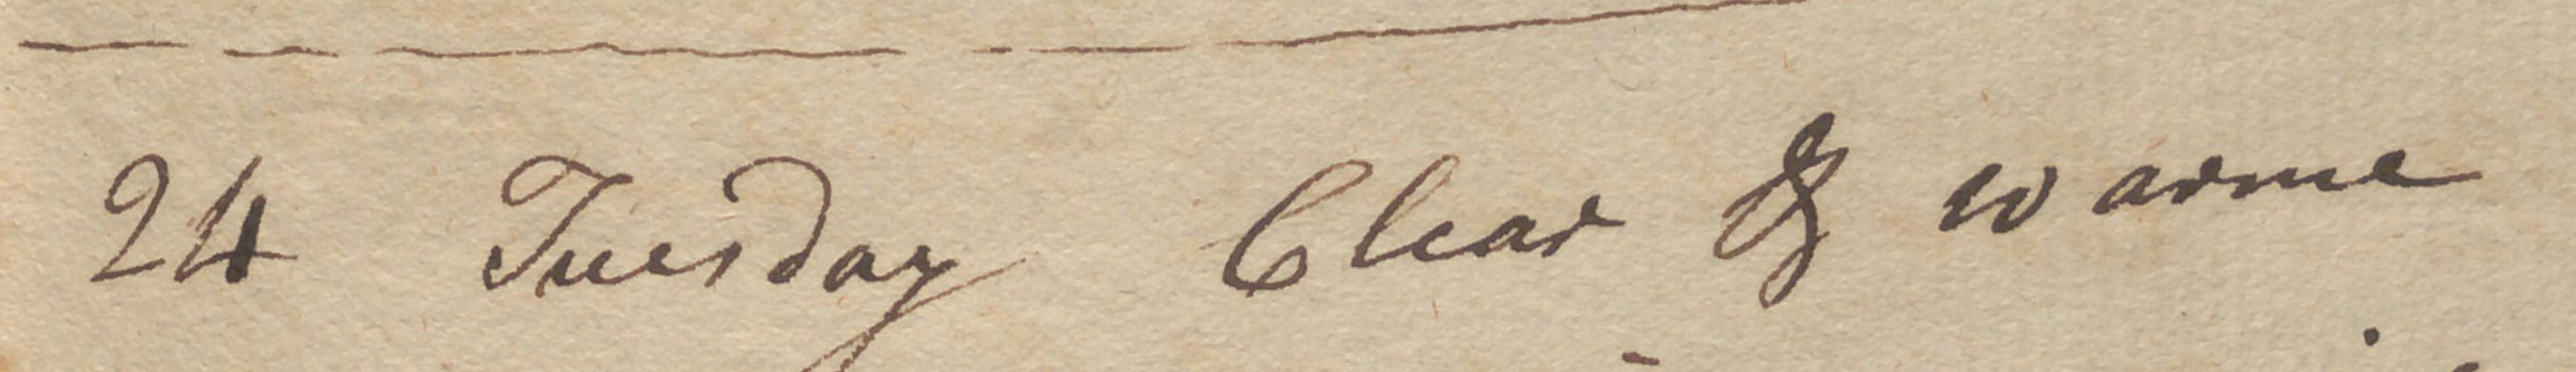24 Tuesday, Clear & warme
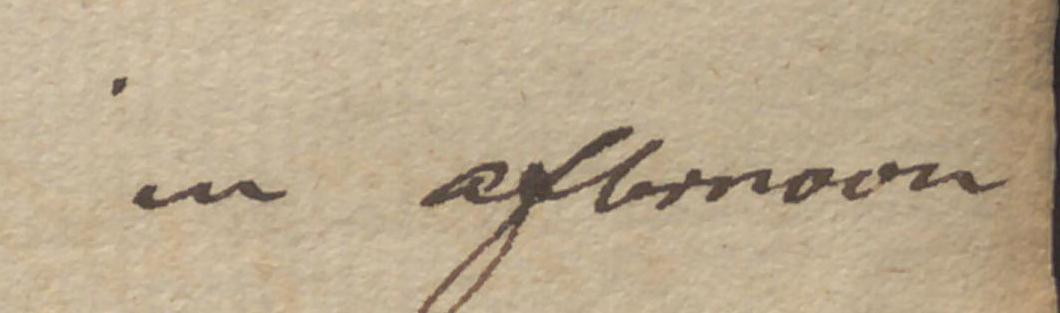in afternoon
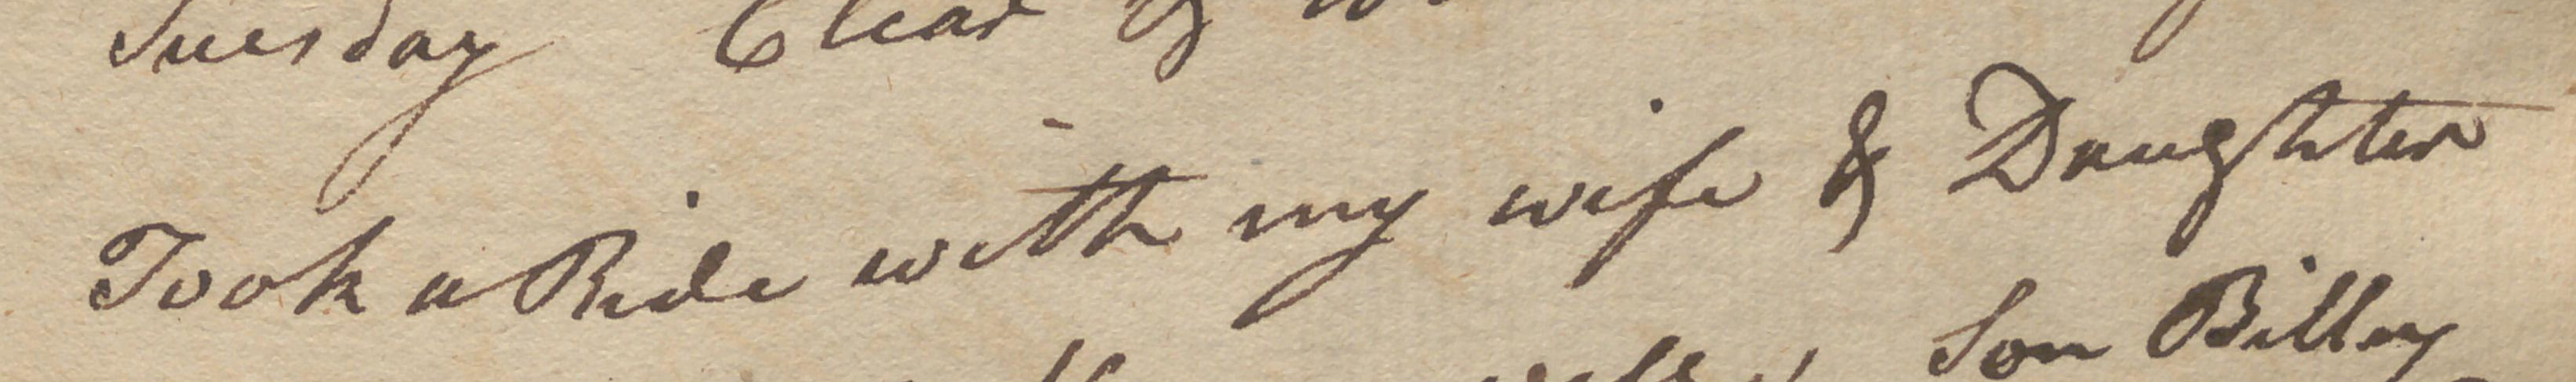Took a Ride with my wife & Daughter
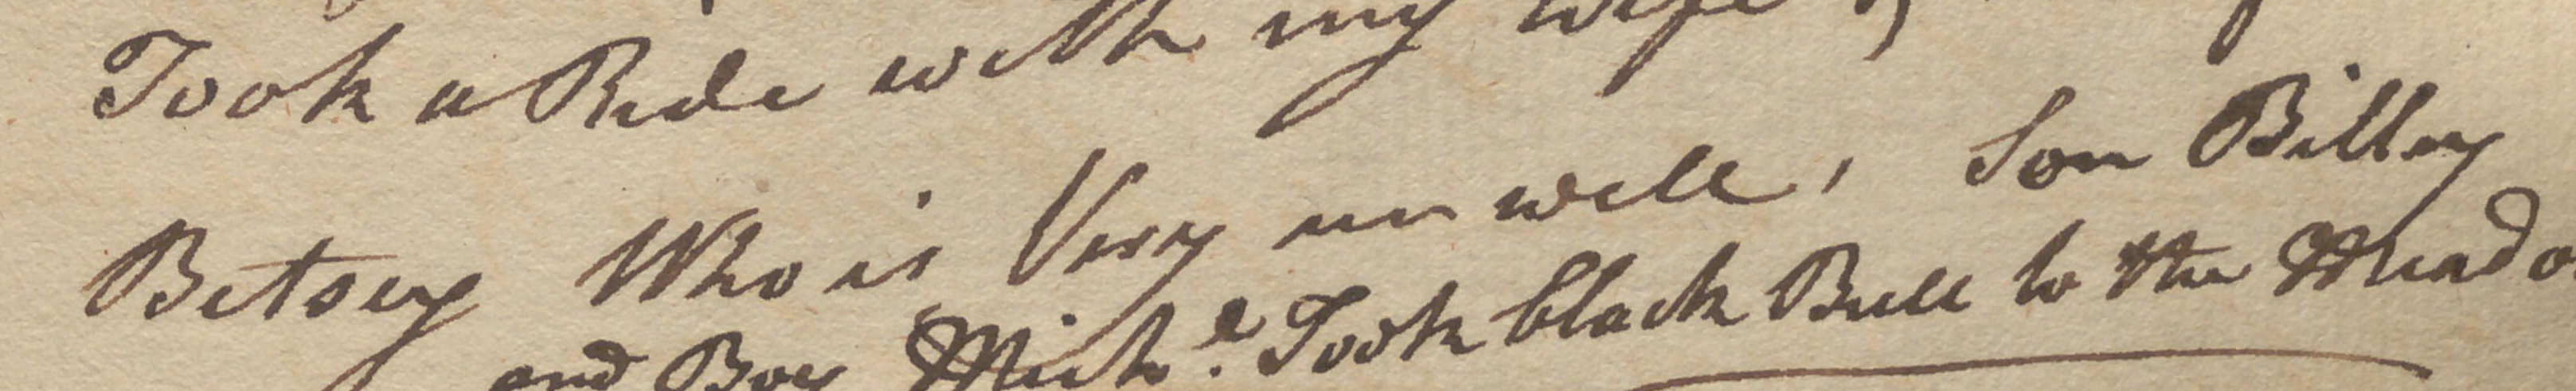Betsey Who is Very unwell, Son Billey
